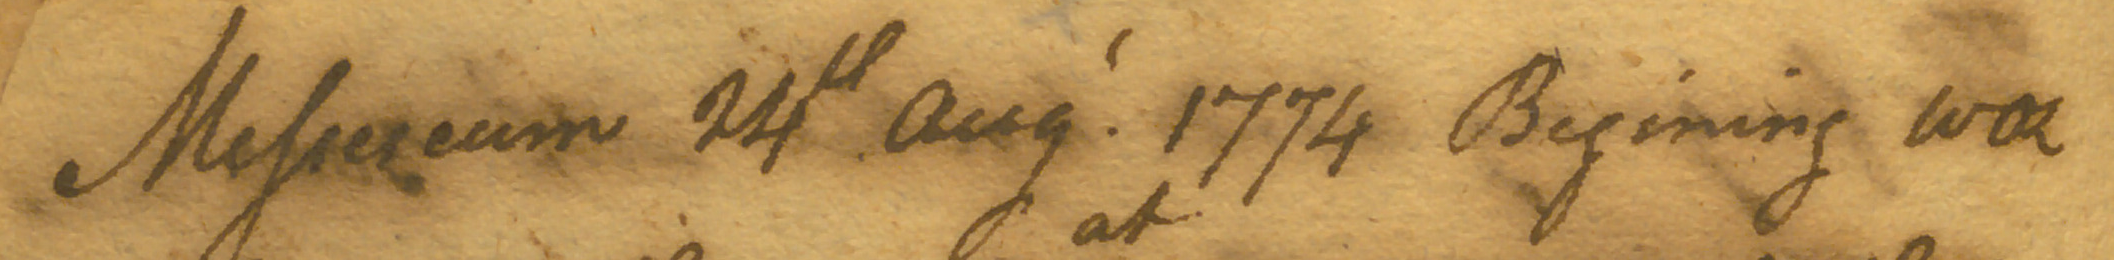Messescum 24^th Aug^t. 1774 Beginning W 0h
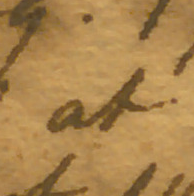at
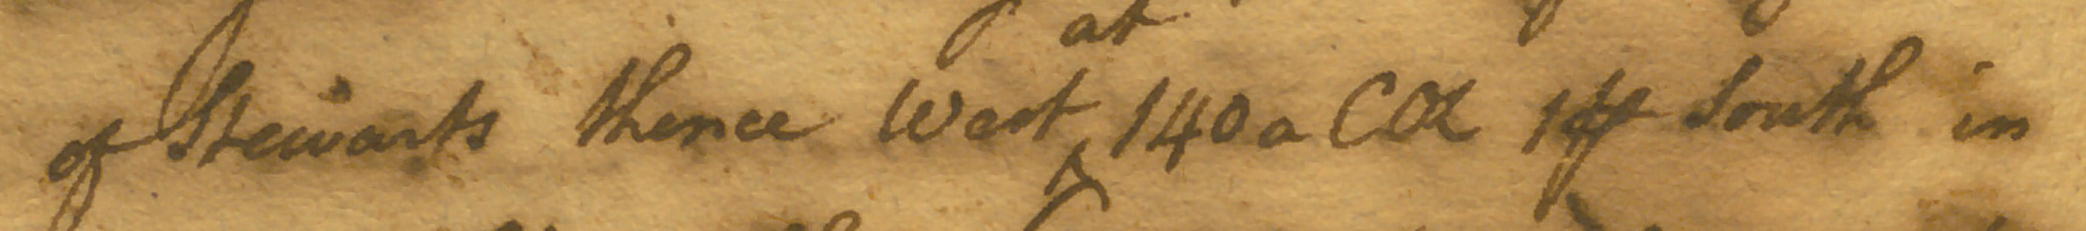of Stewarts thence West ^ 140 a C0h 1 per South in
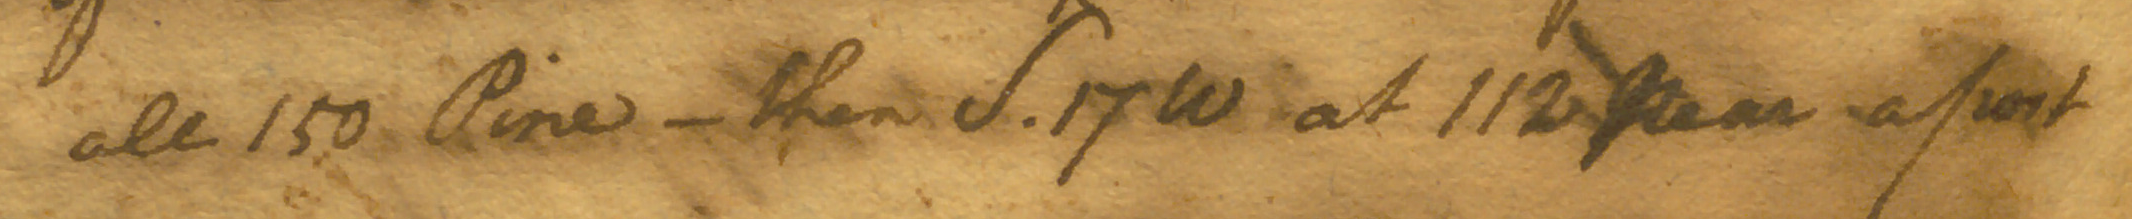all 150 Pine- then S. 17W at 112 stear a port
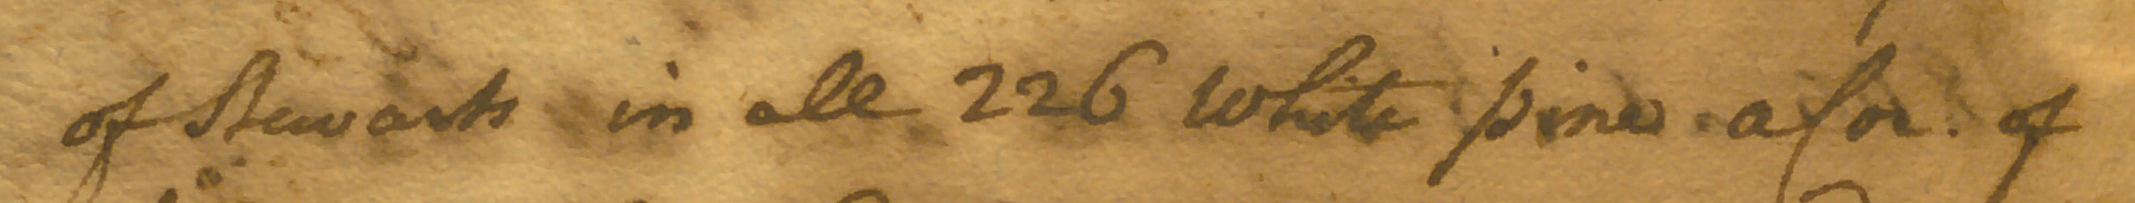of Stewarts in all 226 white pines a Cor. of
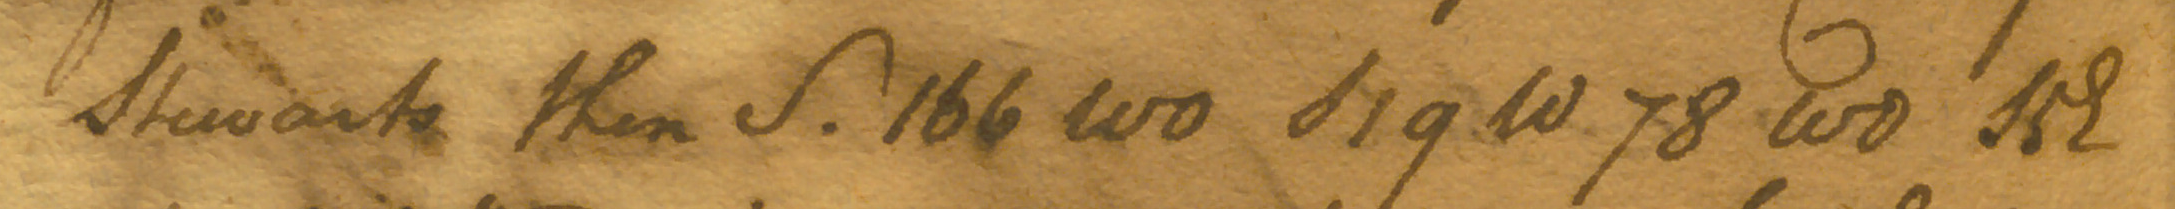Stewarts then S. 166 Wo S 19 W 78 Wo S5E
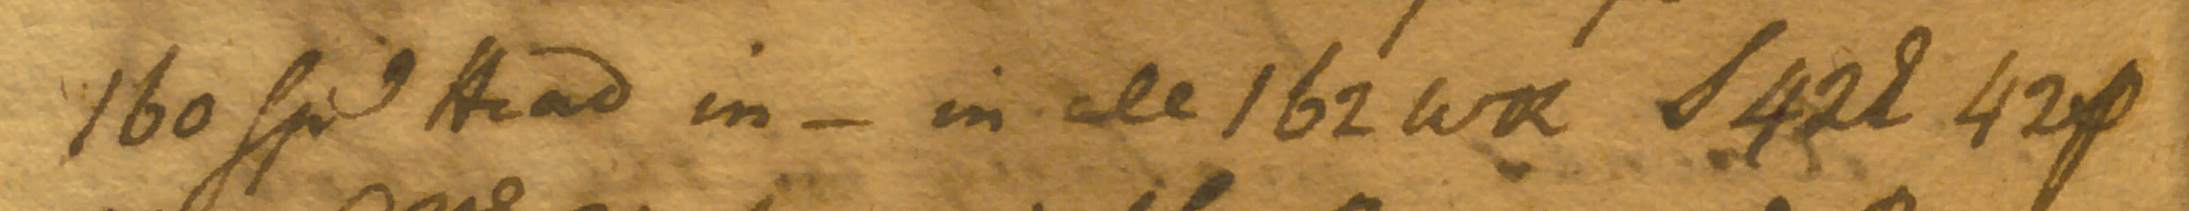160 sp^g Head in- in all 162 W0h S42E 42 per
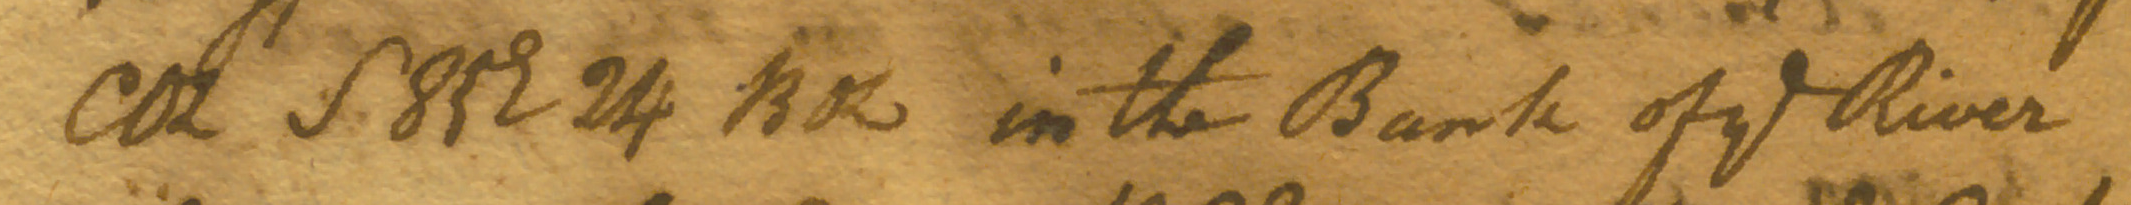C0h S8E2 24 B 0h in the Bank of y^e River
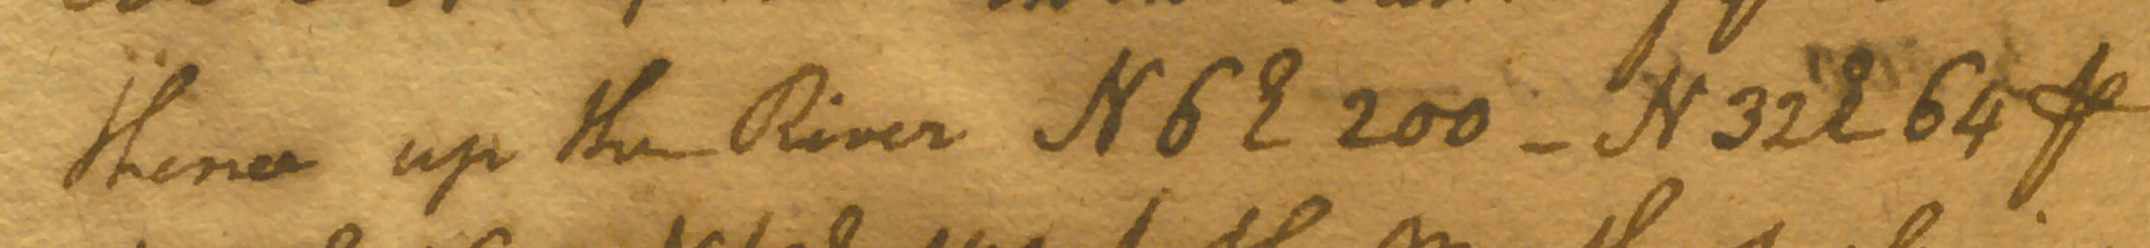thence up the River N6E 200-N32E64 per
